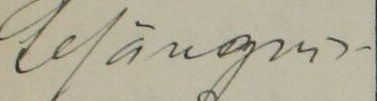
Gefängnis
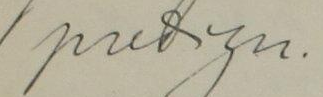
prediger
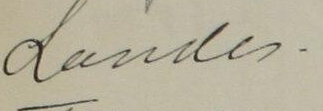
Landes
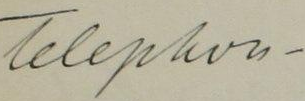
telephon
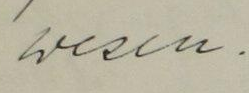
wesen
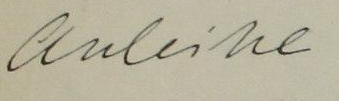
Anleihe
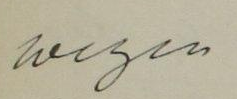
wegen
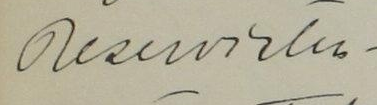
Reservisten
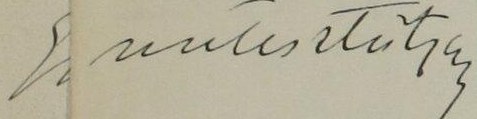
unterstützung
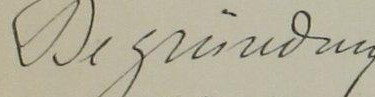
Begründung
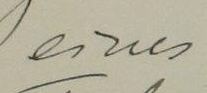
eines
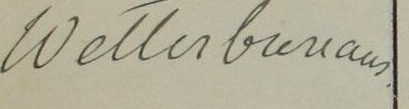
Wetterbureaus
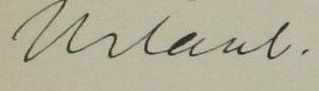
Urlaub
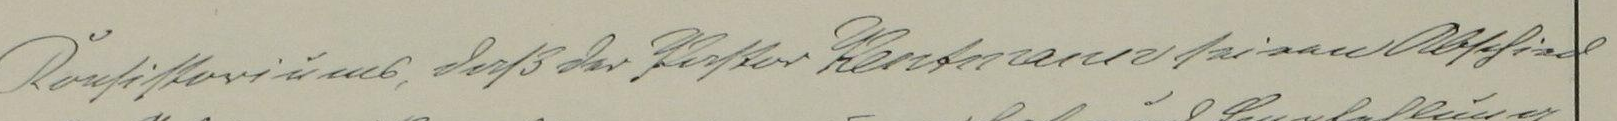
Konsistoriums, daß der Pastor Kentmann seinen Abschied
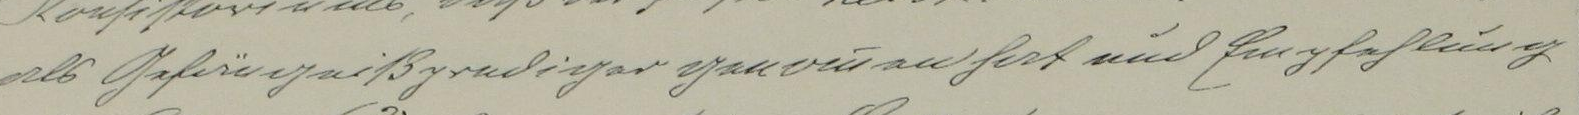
als Gefängnißprediger genommen hat und Empfehlung
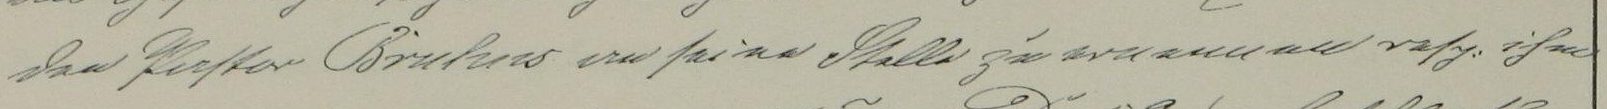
den Pastor Bruhns an seine Stelle zu ernennen resp. ihm
